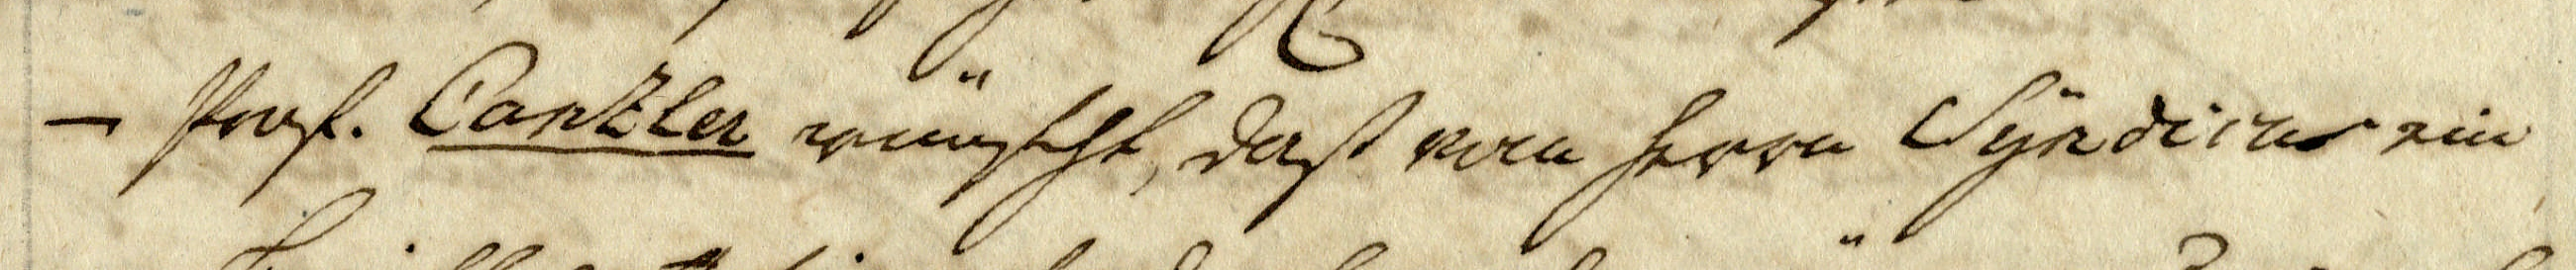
Prof. Canzler wünscht, daß vom Herrn Sÿndicus ein
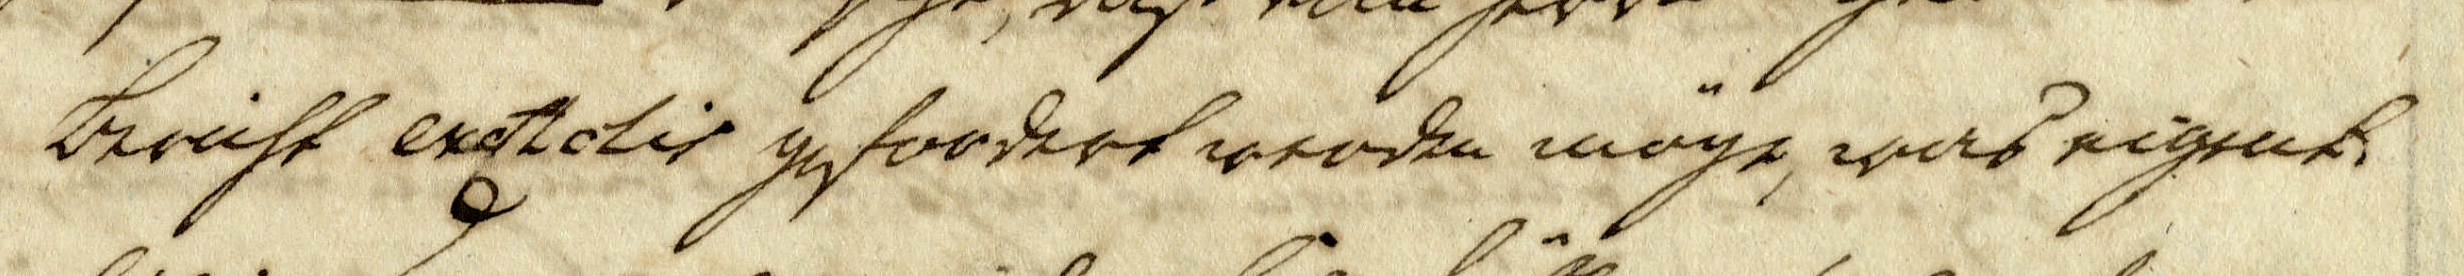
Bericht exActis gefordert werden möge, was eigent¬
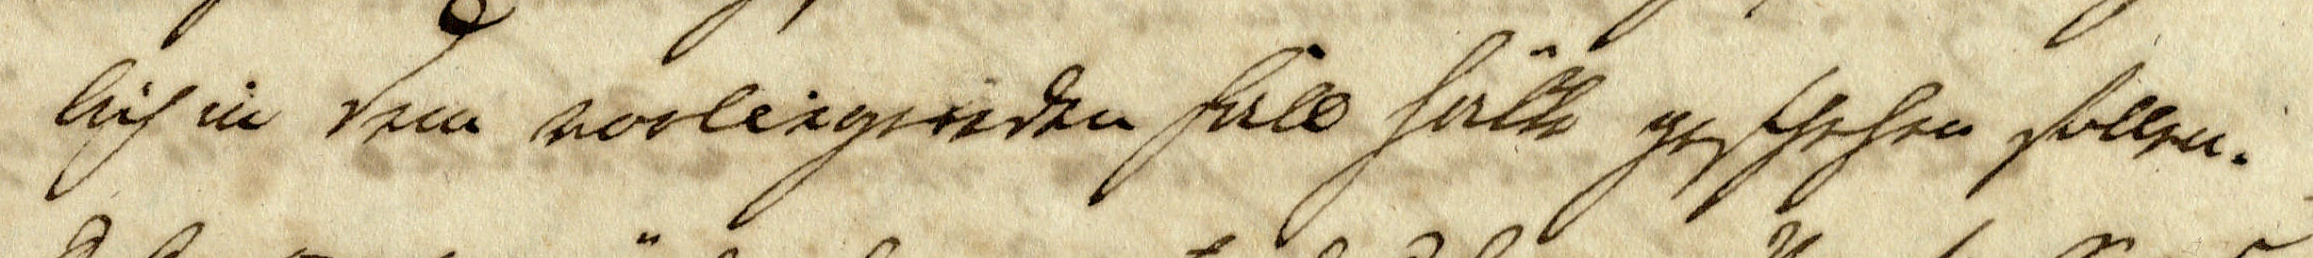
lich in dem vorliegenden Fall hätte geschehen sollen.
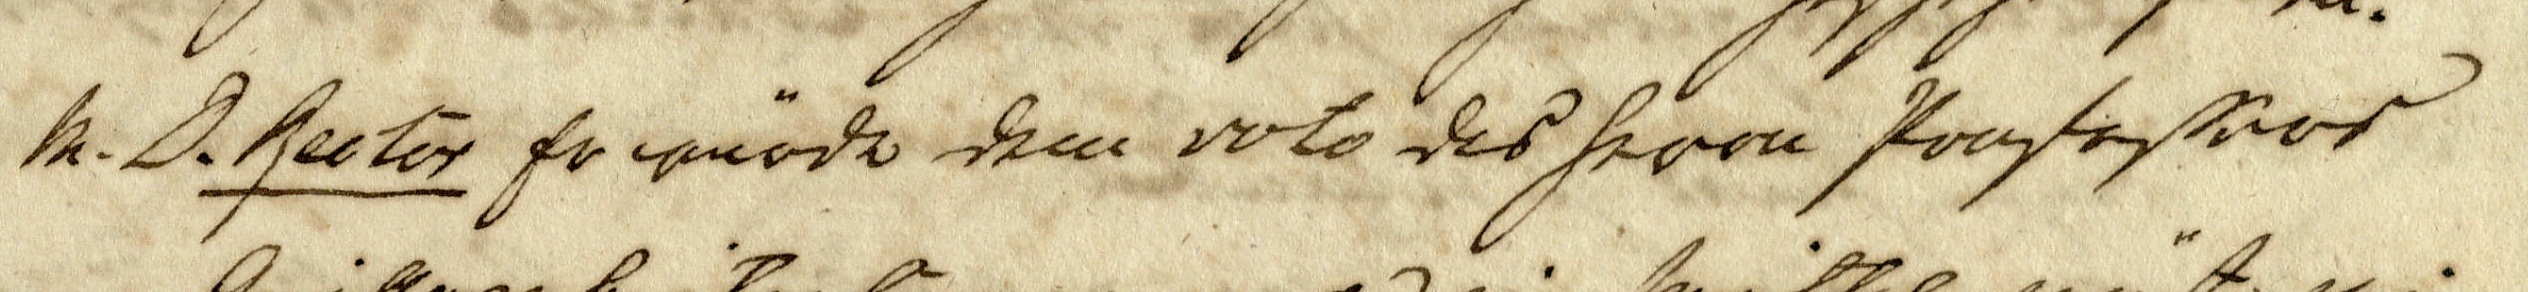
M. D. Rector Er würde dem voto des Herrn Professors
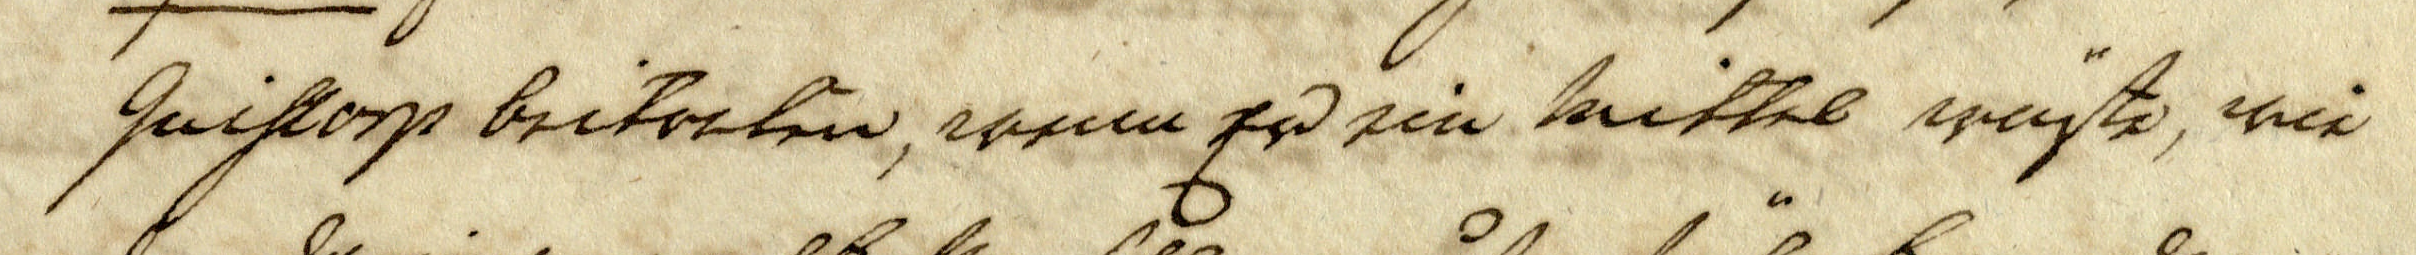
Quistorp beitreten, wenn Er ein Mittel wüßte, wie
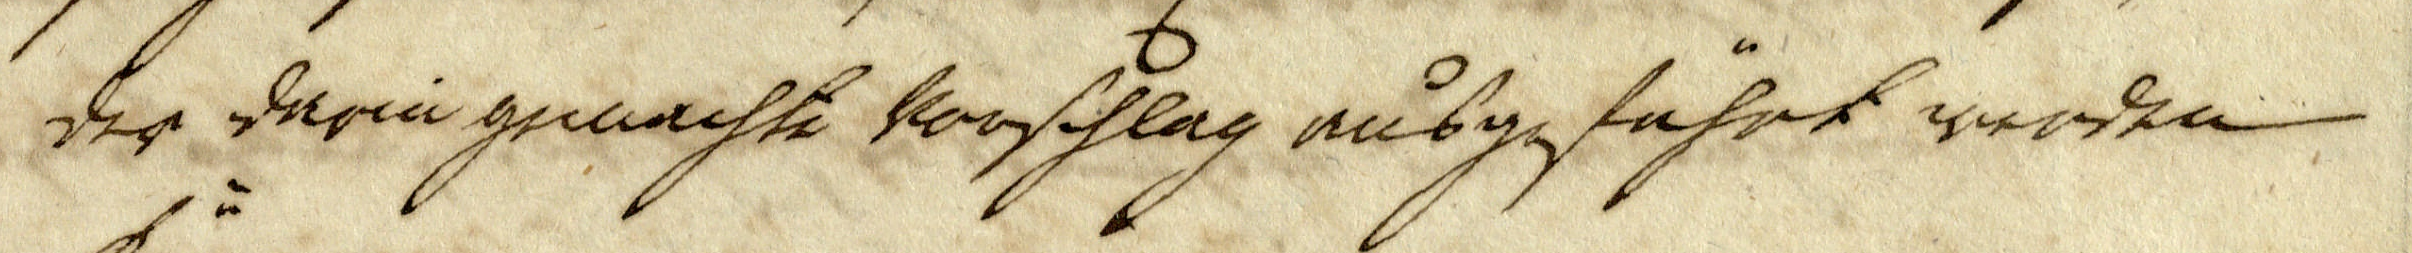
der darin gemachte Vorschlag ausgeführt werden
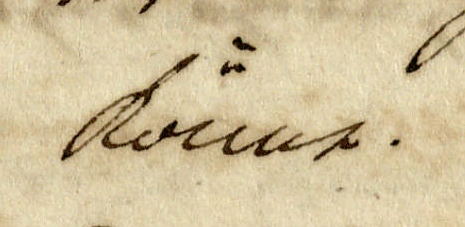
könne.
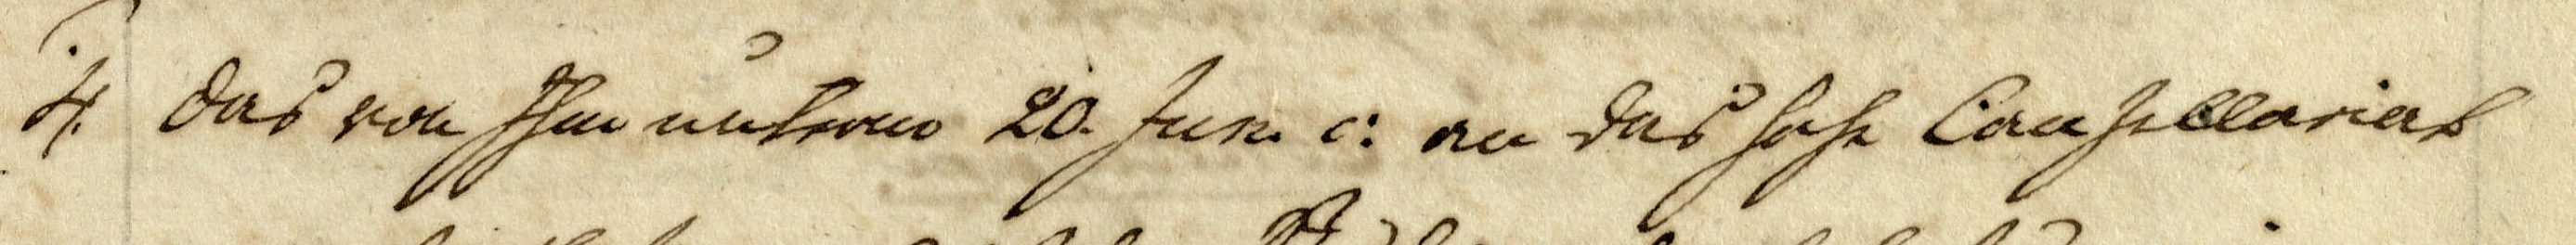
4. Das von Ihm unterm 20. Jun. c. an das hohe Canzellariat
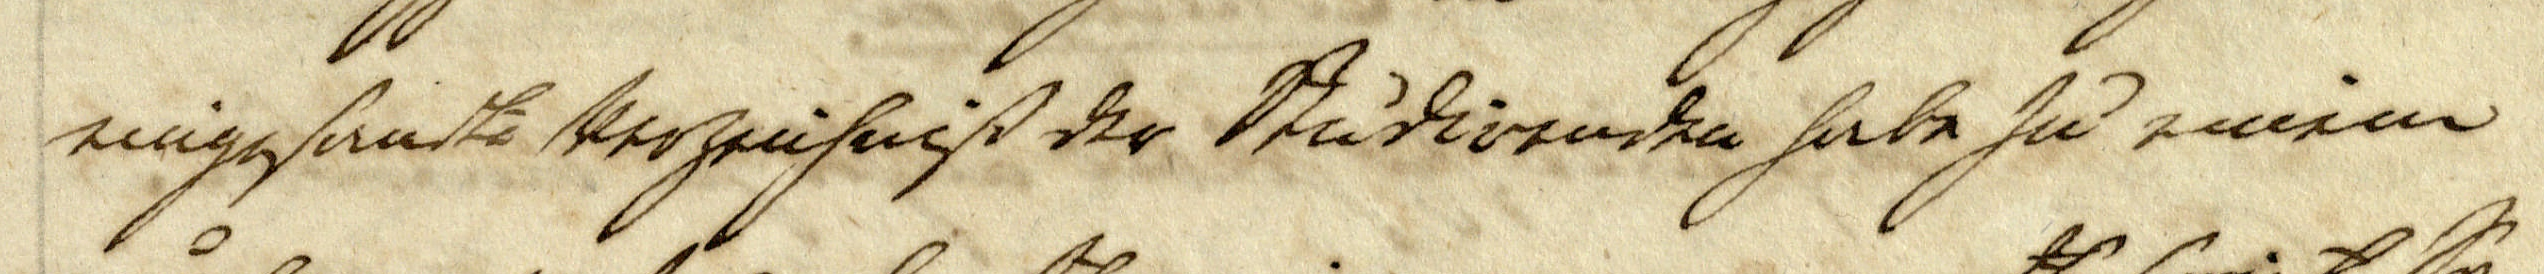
eingesandte Verzeichniß der Studirenden habe zu einem
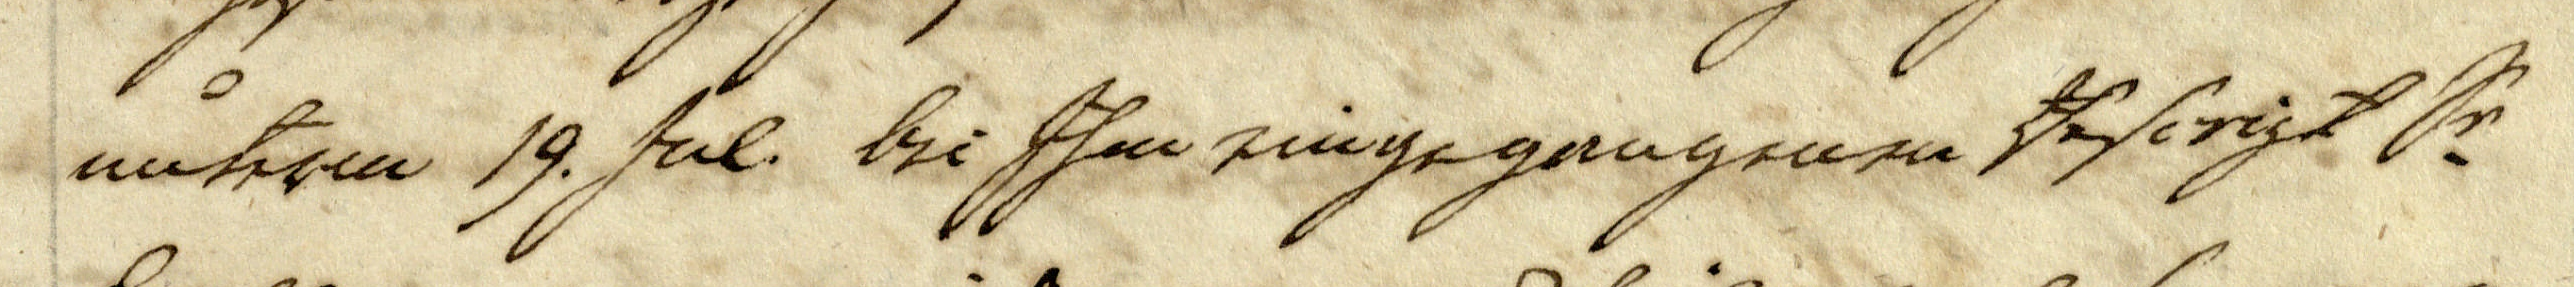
unterm 19. Jul. bei Ihm eingegangenen Rescript Sr
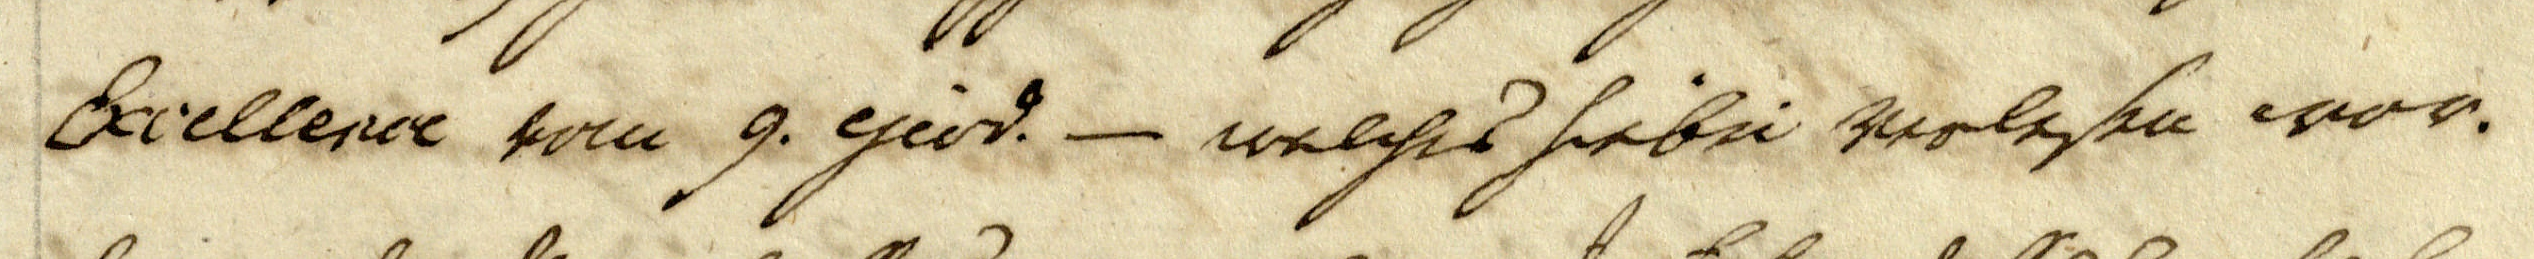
Excellence vom 9. ejusd. welches hiebei verlesen wor¬
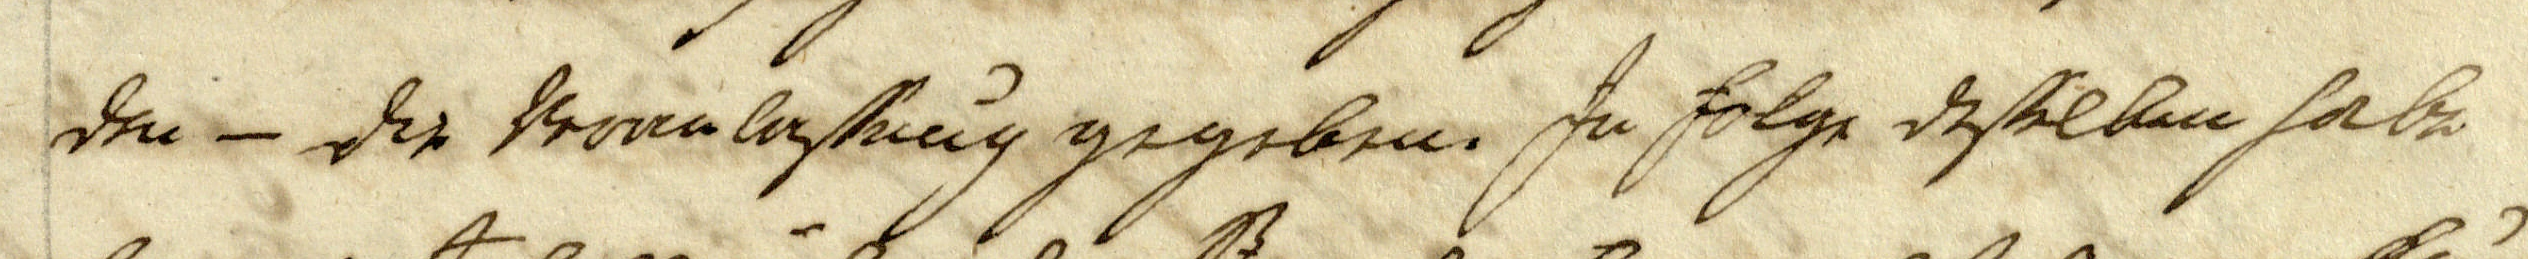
den die Veranlassung gegeben. In Folge desselben habe
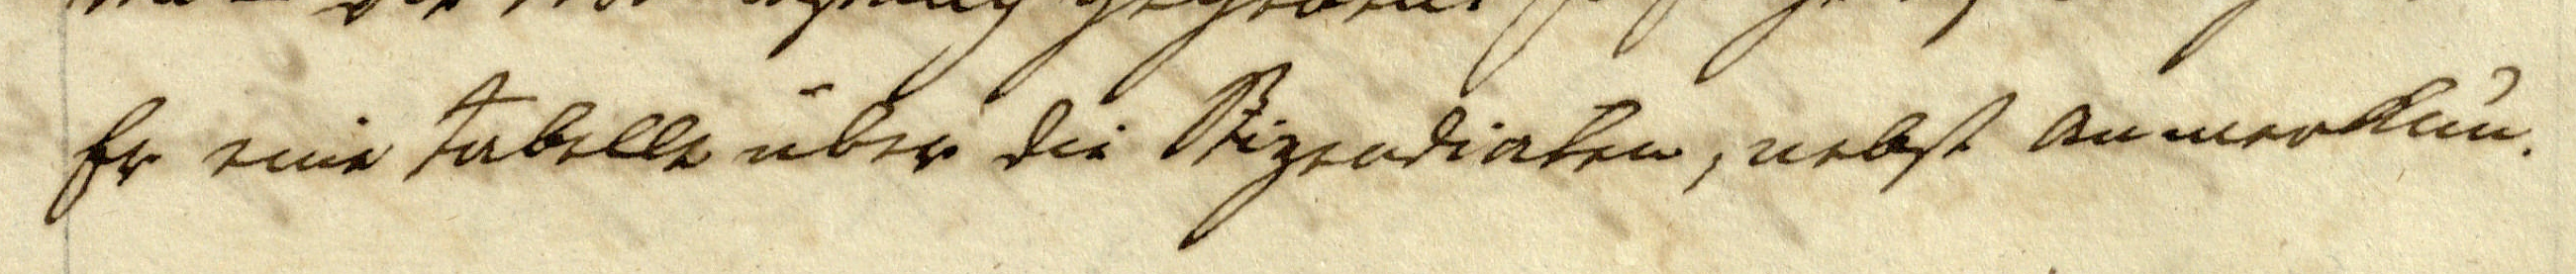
Er eine Tabelle über die Stipendiaten, nebst Anmerkun¬
